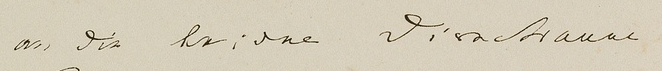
an die beiden Directionen des
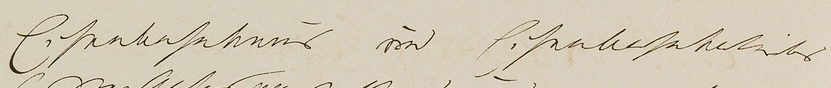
Eisenbahnbaus und Eisenbahnbetriebs
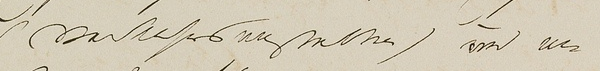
(Verkehrsanstalten) und an
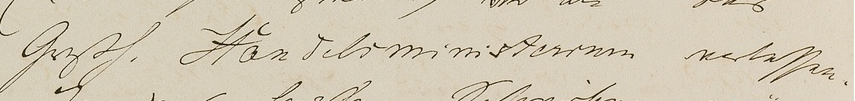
Grossh. Handelsministerium erlassen.
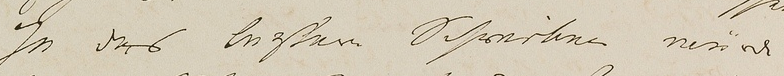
In das letztere Schreiben würde
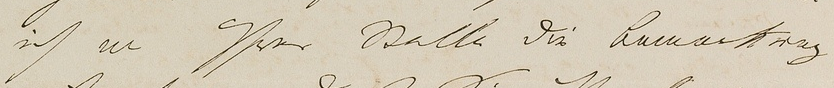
ich an Ihrer Stelle die Bemerkung
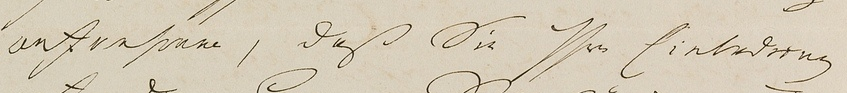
aufnehmen, daß Sie Ihre Einladung
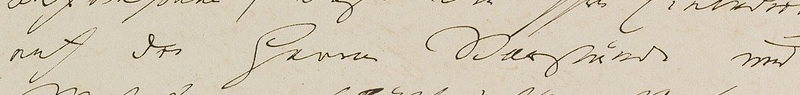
auf die Herrn Vorstände und
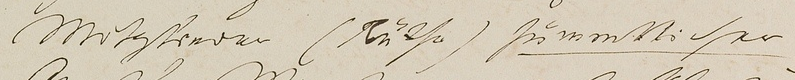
Mitglieder (Räthe) sämmtlicher
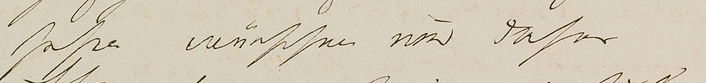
sehen wünschen und daher
